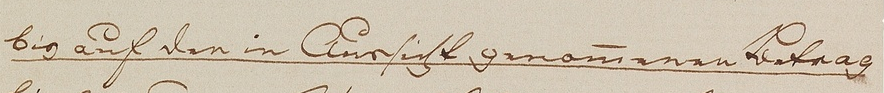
bis auf den in Aussicht genommenen Betrag
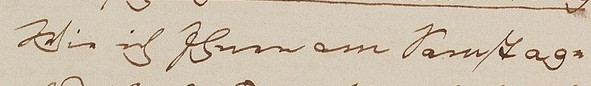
Wie ich Ihnen am Samstage
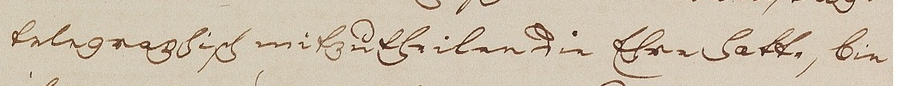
telegraphisch mitzutheilen die Ehre hatte, bin
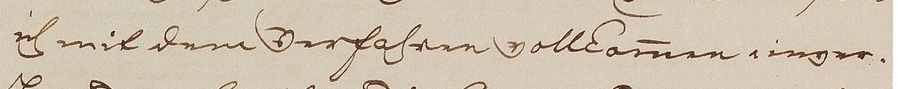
ich mit dem Verfahren vollkommen einver-
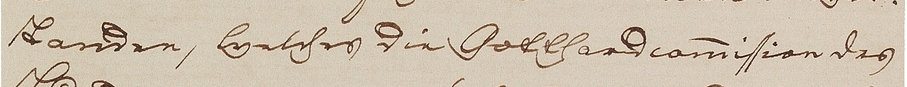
standen, welches die Gotthardcommission des
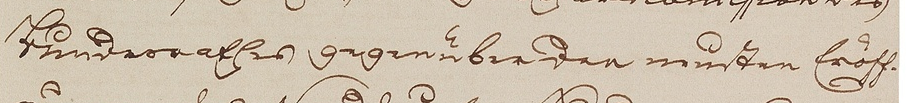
Bundesrathes gegenüber den neusten Eröff-
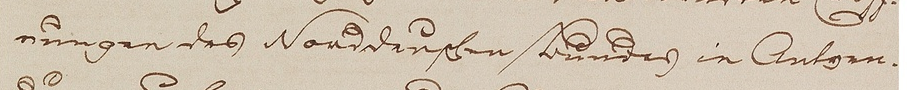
nungen des Norddeutschen Bundes in Anwen-
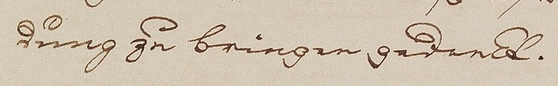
dung zu bringen gedenkt.
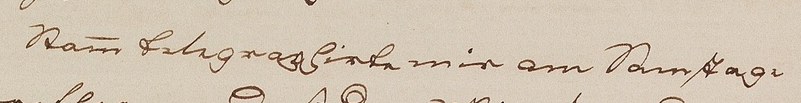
Stamm telegraphirte mir am Samstage
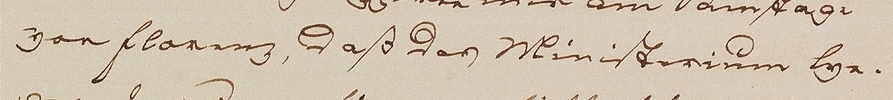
von Florenz, daß das Ministerium we-
